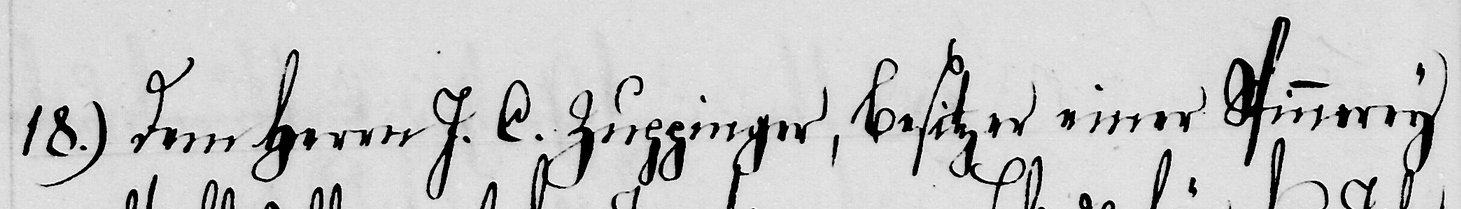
18.) Dem Herrn J. C. Zuppinger, Besitzer einer Spinnerey
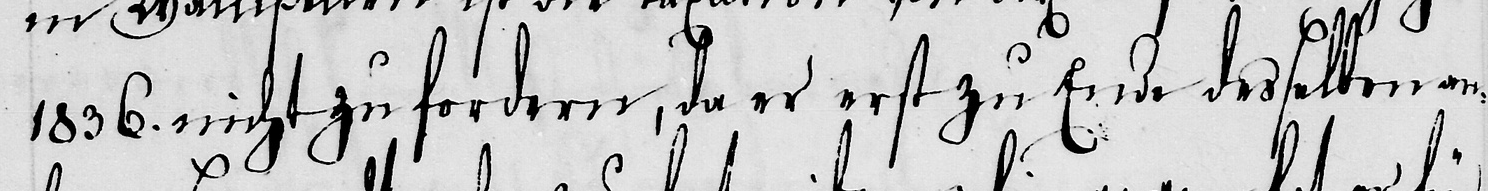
1836. nicht zu fordern, da er erst zu Ende desselben a¬
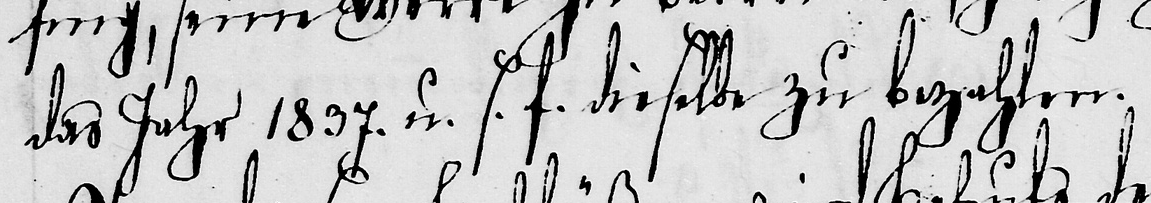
das Jahr 1837. u. s. f. dieselbe zu bezahlen.
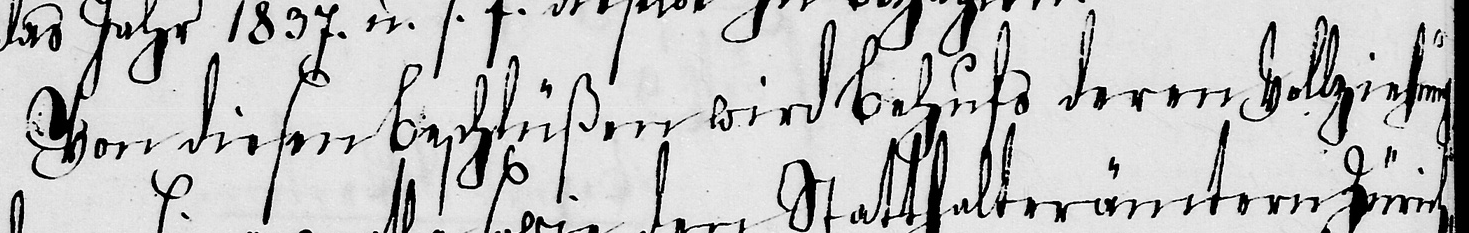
Von diesen Beschlüßen wird Behufs deren Vollziehu¬
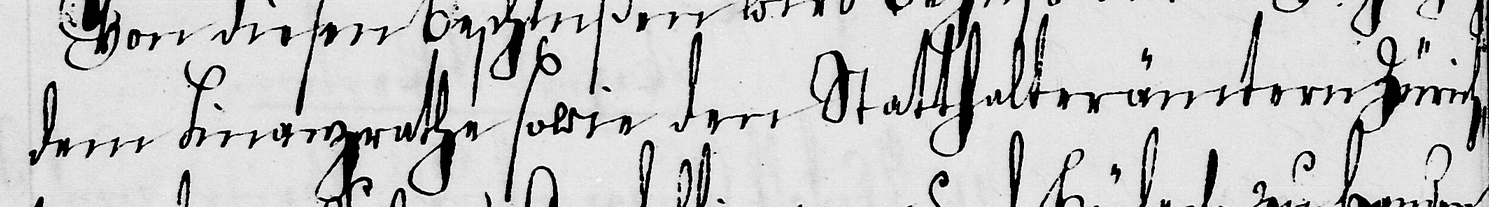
dem Finanzrathe sowie den Statthalterämtern Züri¬
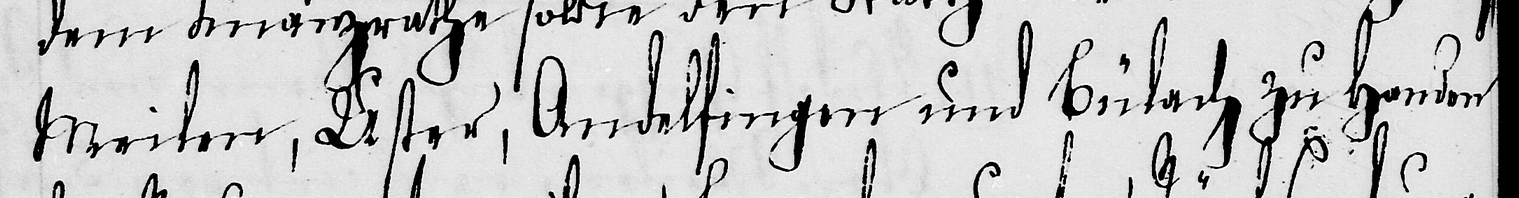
Meilen, Uster, Andelfingen und Bülach zu Handen
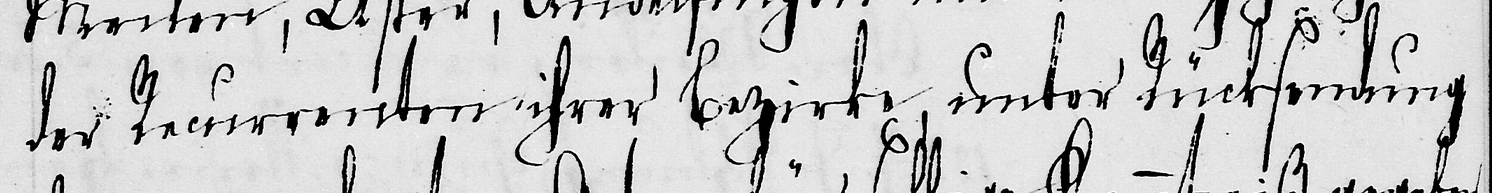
der Recurrenten ihrer Bezirke unter Rücksendung
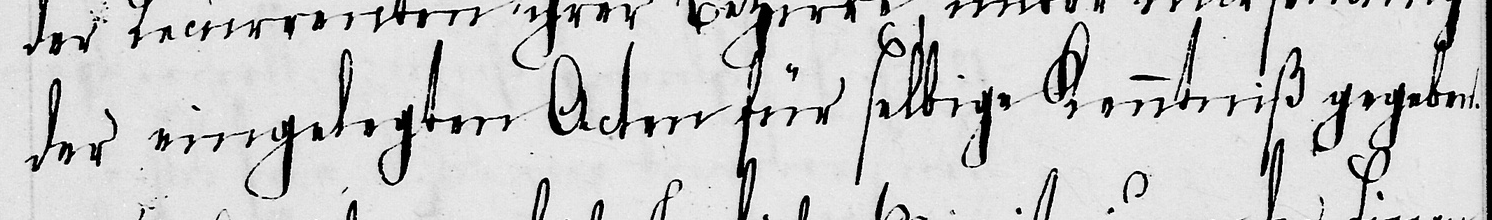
der eingelegten Acten für selbige Kenntniß gegebe¬
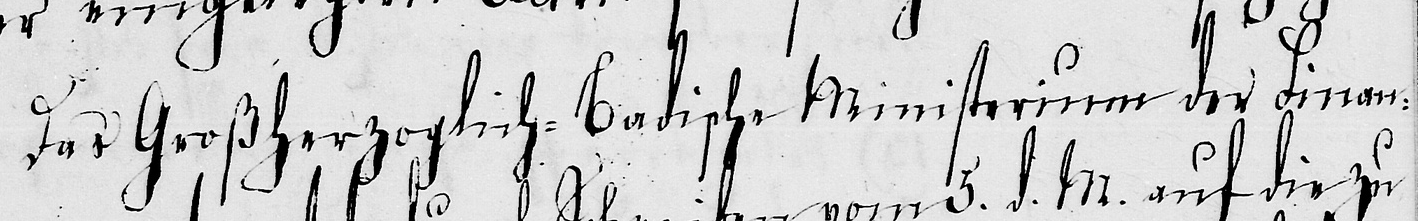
Das Großherzoglich-Badische Ministerium der Finan¬
